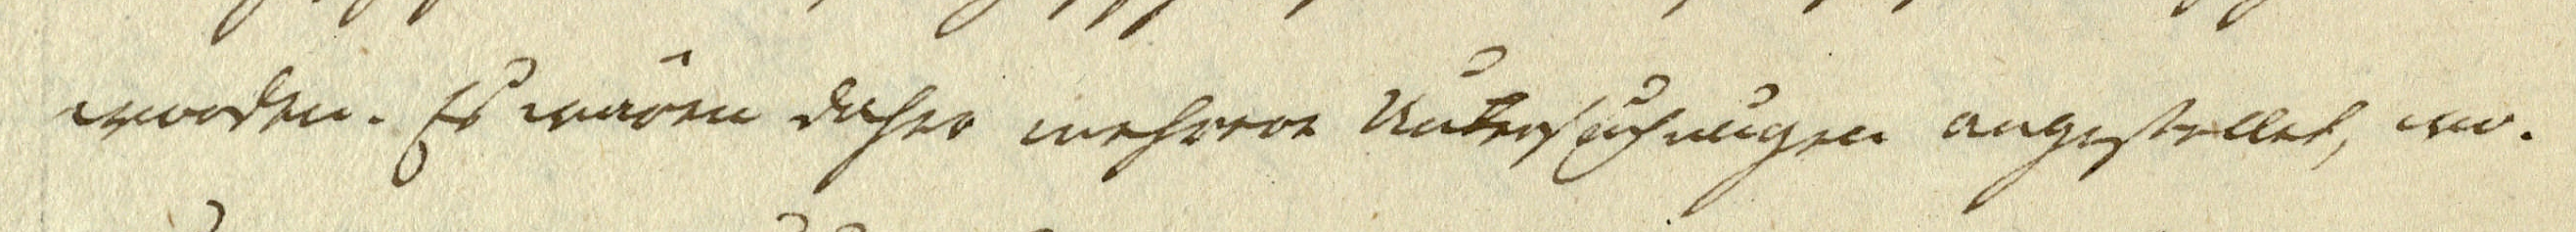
worden. Es wären daher mehrere Untersuchungen angestellet, wo¬
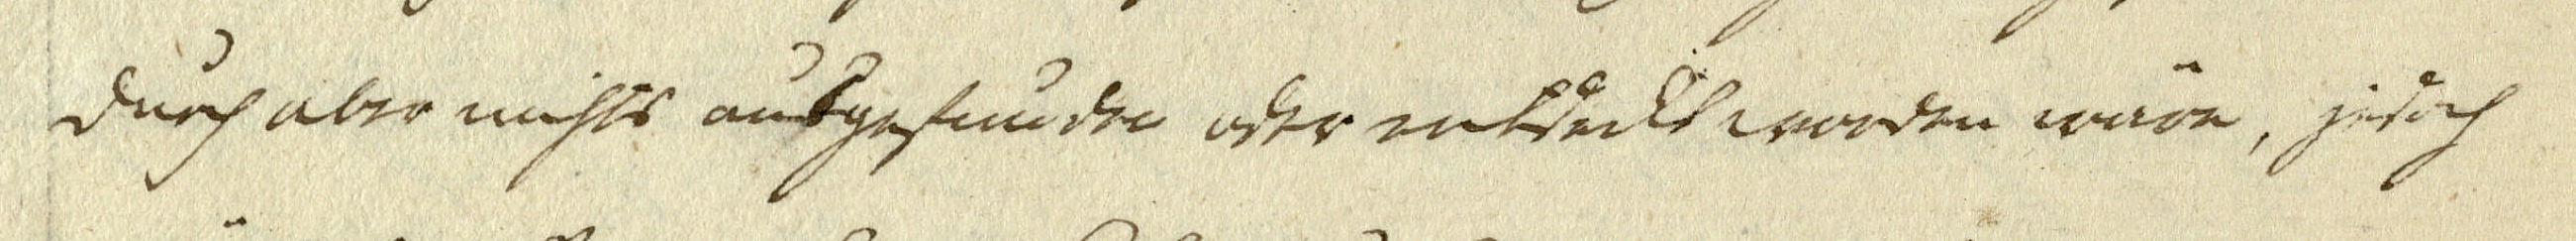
durch aber nichts aufgefunden oder entdeckt worden wäre, jedoch
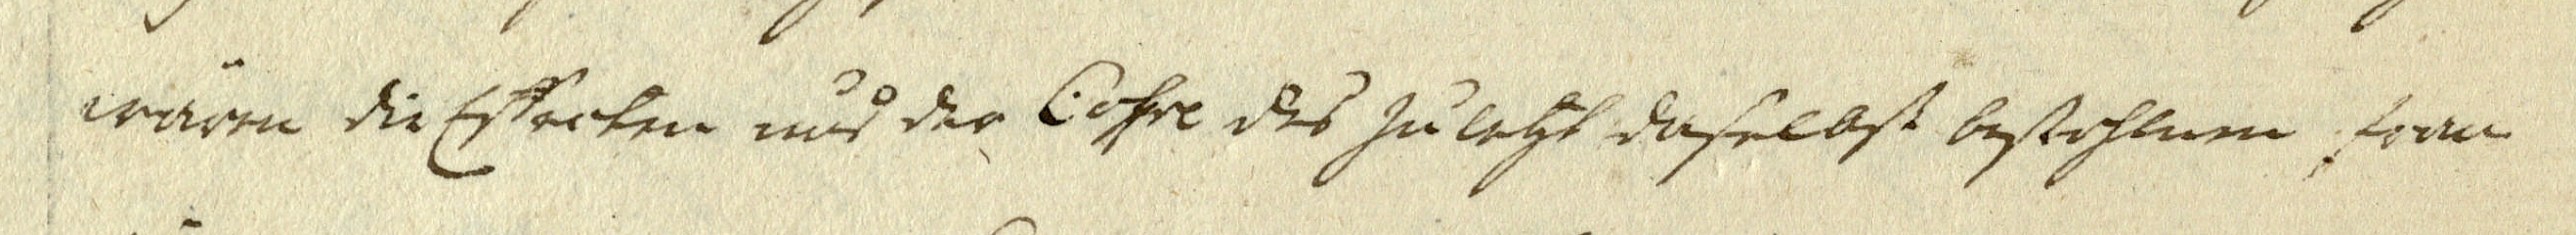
wären die Effecten und der Cofre des zuletzt daselbst bestohlenen fran¬
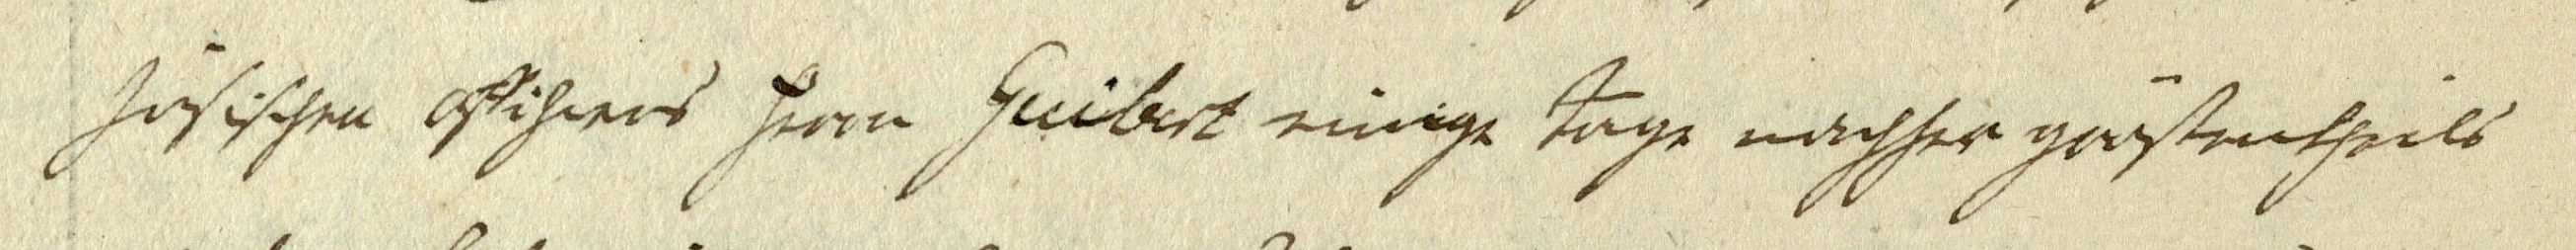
zösischen Offizers Herrn Guibert einige Tage nachher gröstentheils
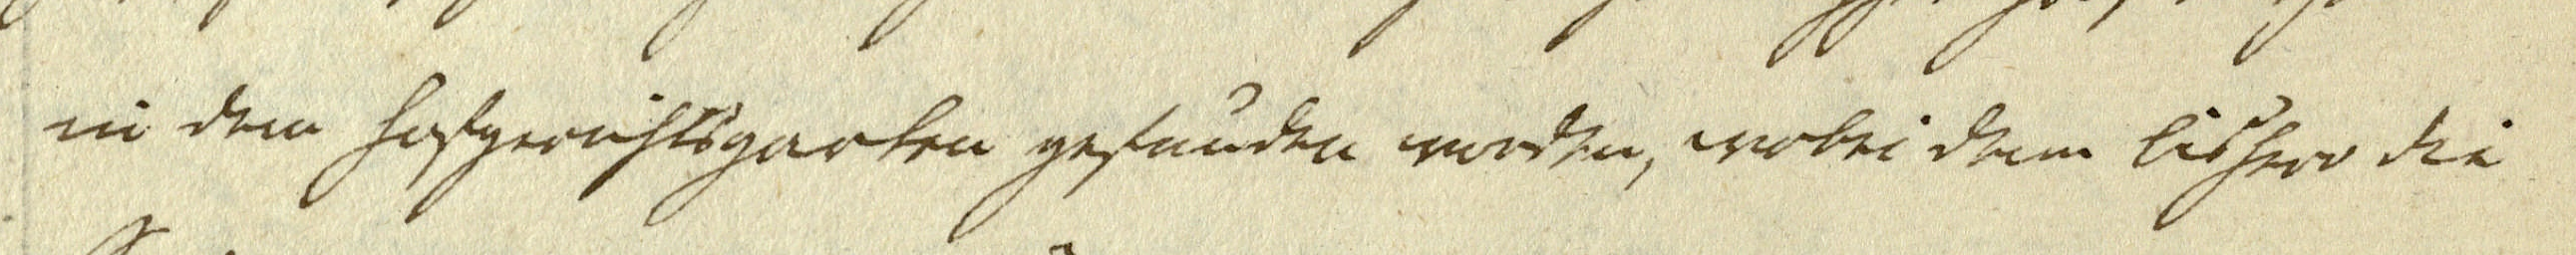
in dem Hofgerichtsgarten gefunden worden, wobei denn bishero die
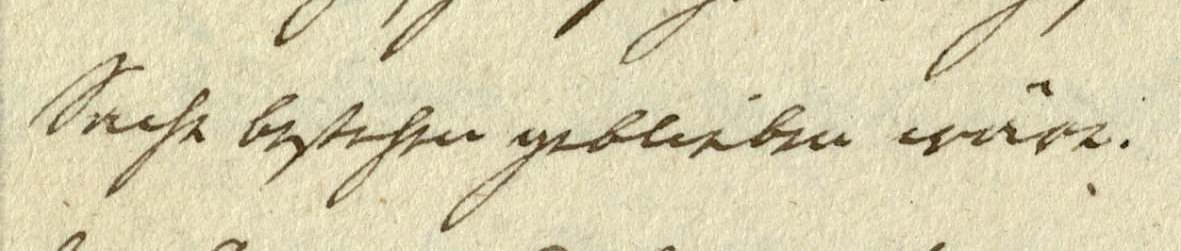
Sache bestehen geblieben wäre.
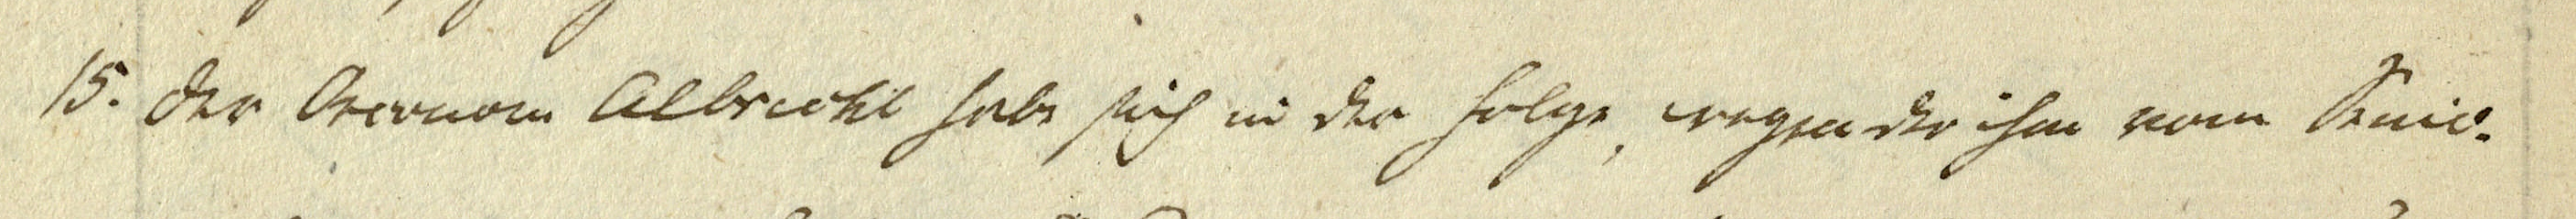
15. Der Oeconom Albrecht habe sich in der Folge, wegen der ihm vom Senio¬
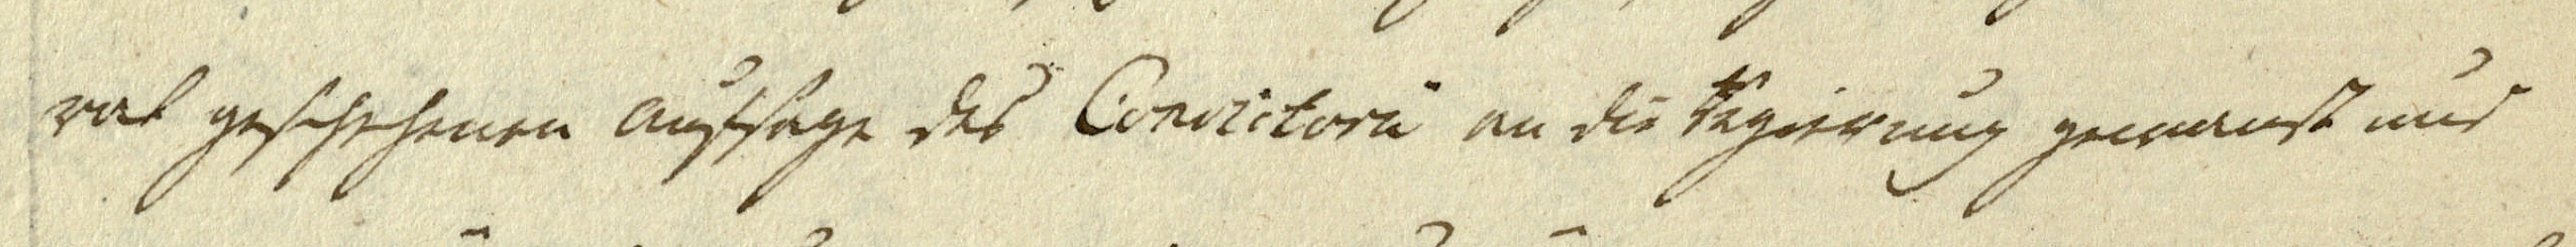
rat geschehenen Aufsage des Convictorii an die Regierung gewandt und
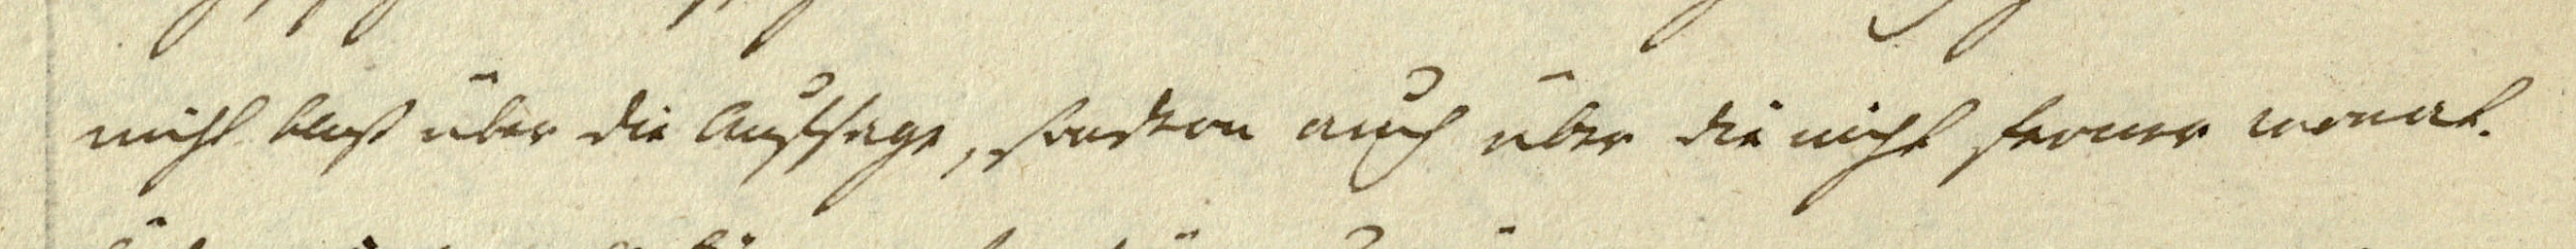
nicht bloß über die Aufsage, sondern auch über die nicht ferner monat¬
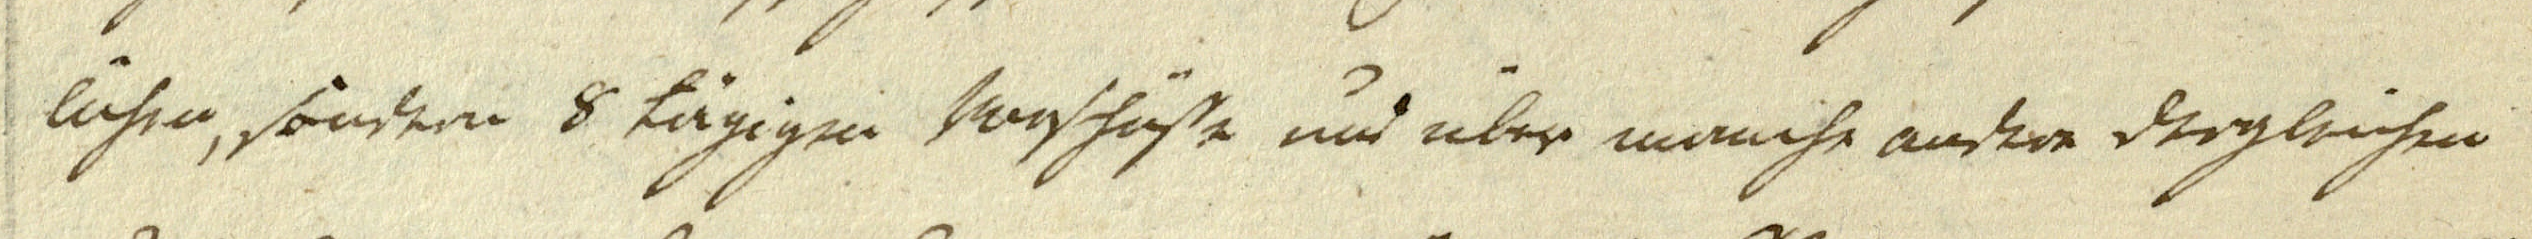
lichen, sondern 8 tägigen Vorschüsse und über manche andere dergleichen
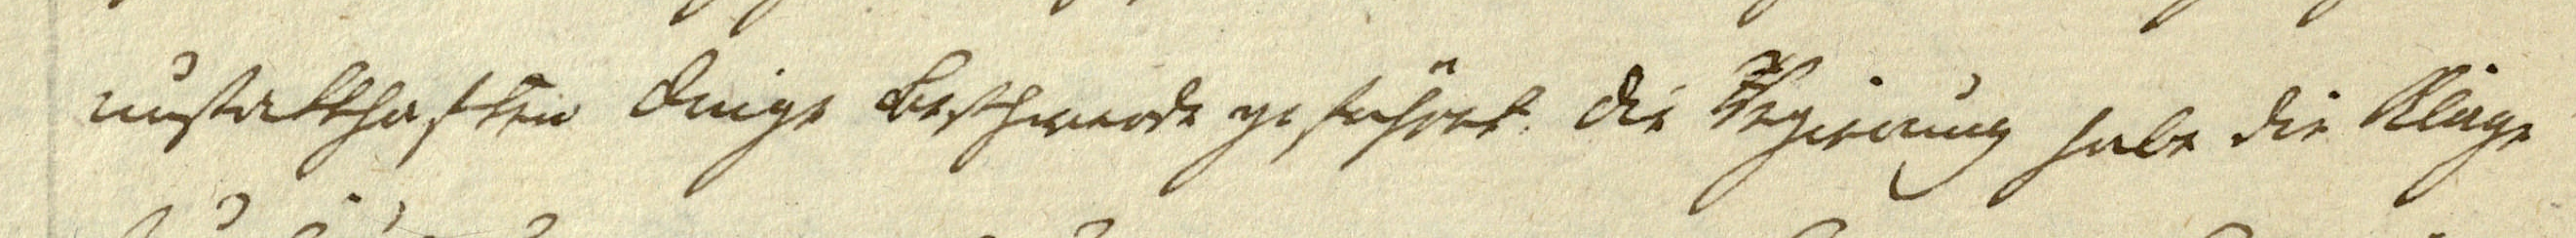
unstatthaften Dinge Beschwerde geführet. Die Regierung habe die Klage
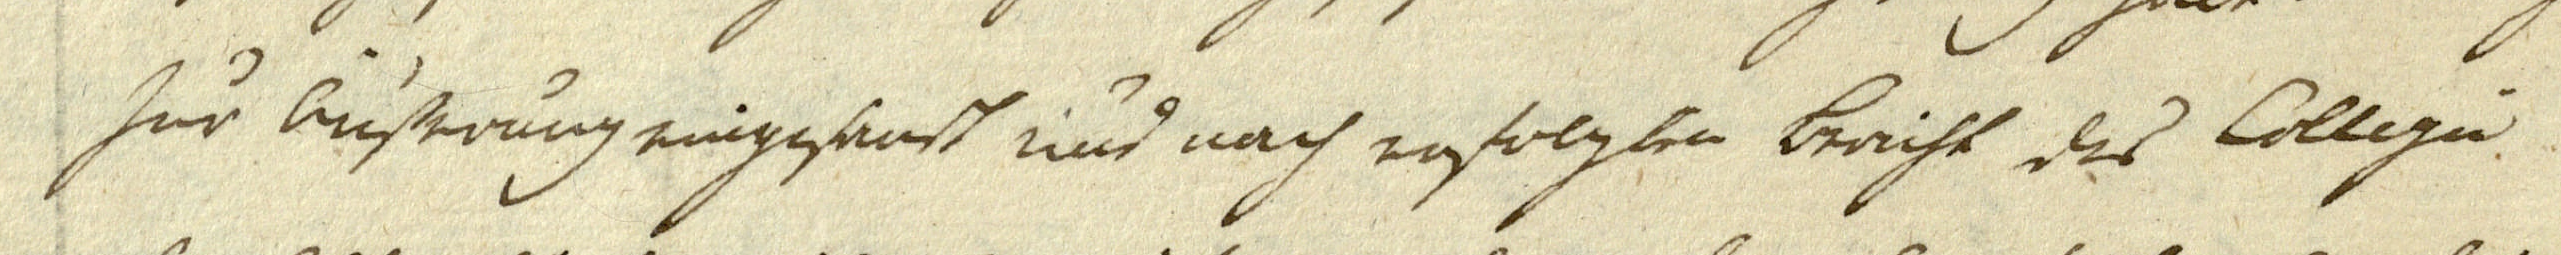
zur Äusserung eingesandt und nach erfolgten Bericht des Collegii
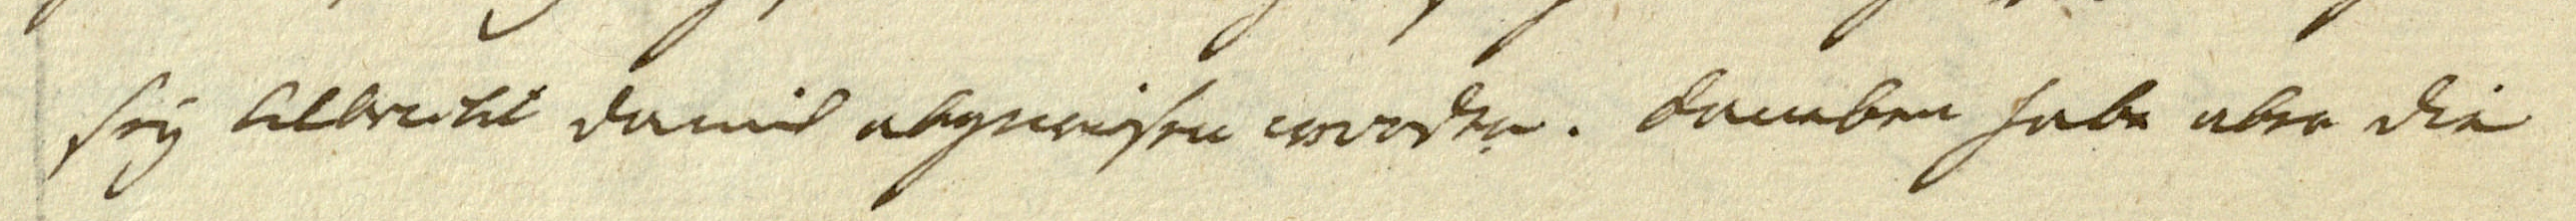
seÿ Albrecht damit abgewiesen worden. Daneben habe aber die
